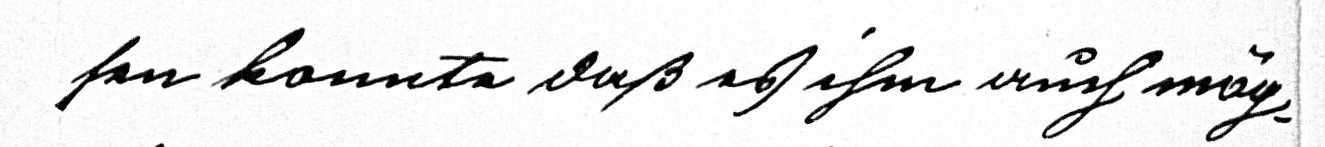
sen konnte daß es ihm auch mög¬
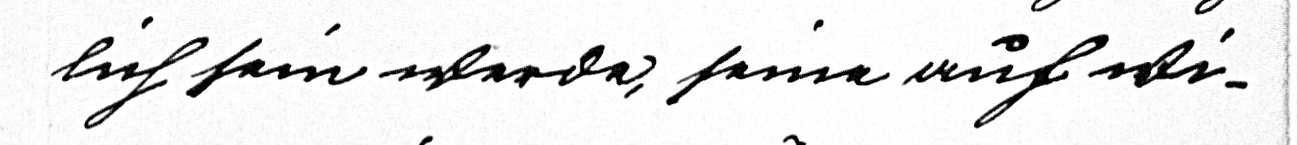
lich sein werde, seine auf wi¬
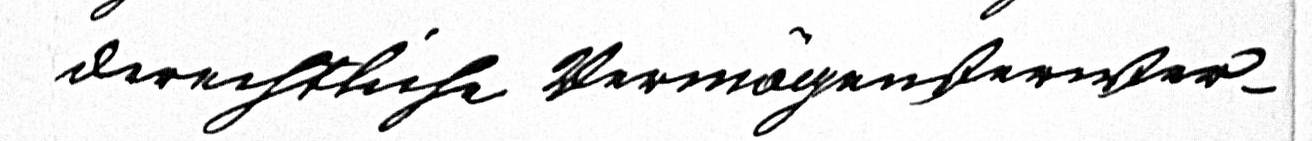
derechtliche Vermögenserwer¬
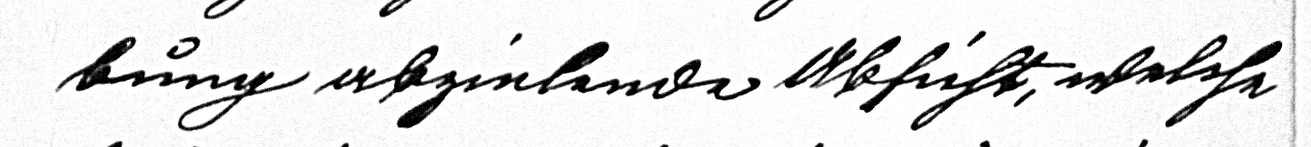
bung abzielende Absicht, welche
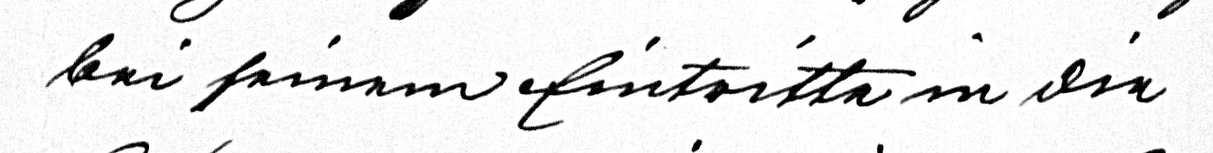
bei seinem Eintritte in die
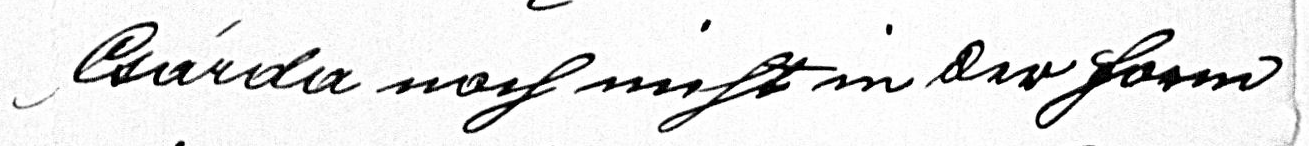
Csárda noch nicht in der Form
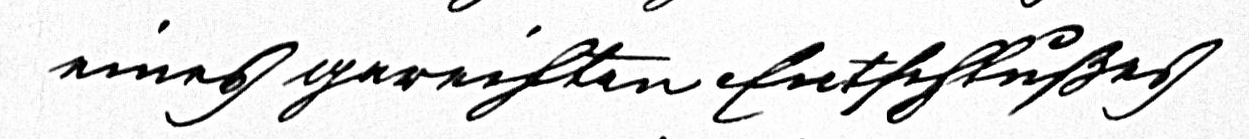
eines gereiften Entschlußes
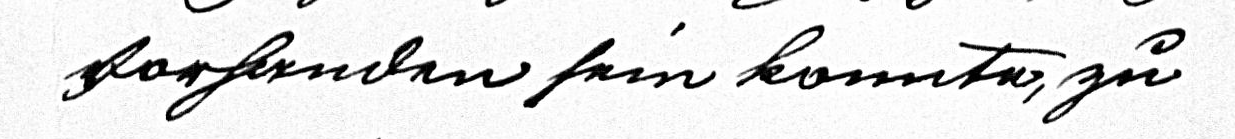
vorhanden sein konnte, zu
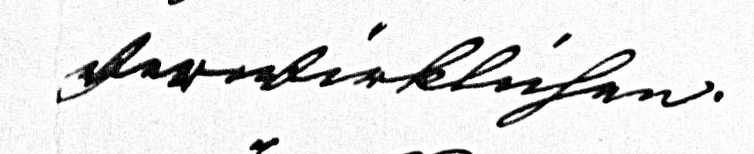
verwirklichen.
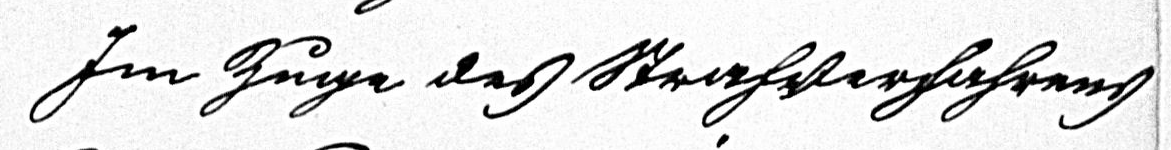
Im Zuge des Strafverfahrens
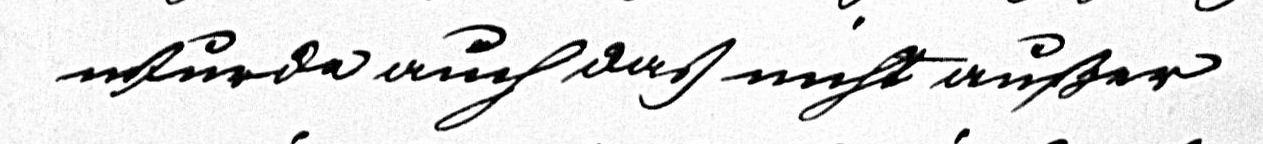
wurde auch das nicht außer
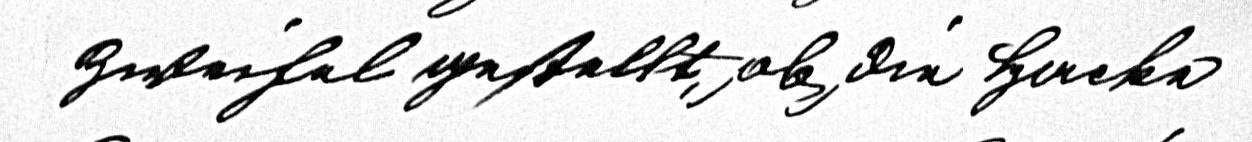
Zweifel gestellt, ob die Hacke
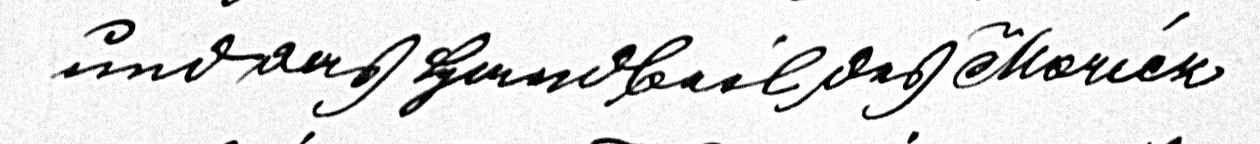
und das Handbeil des Morcéz
